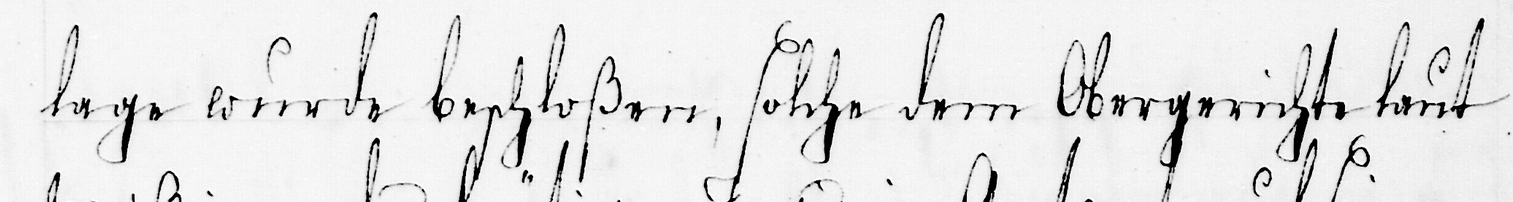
lage wurde beschloßen, solche dem Obergerichte laut
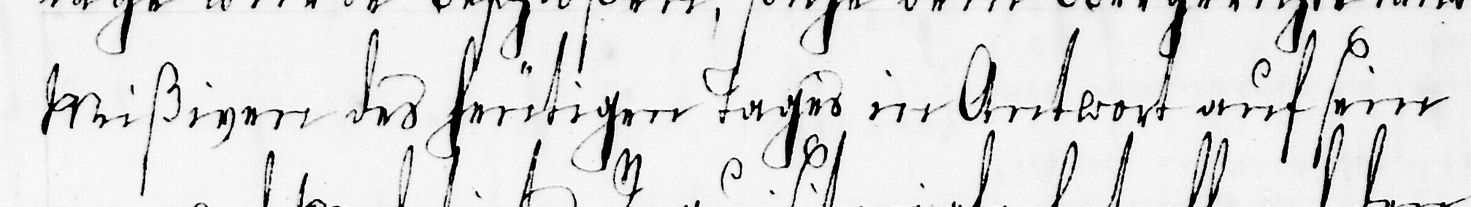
Mißiven des heutigen Tages in Antwort auf sein
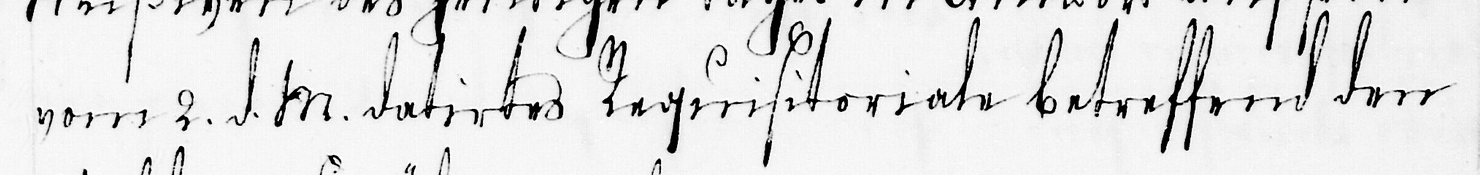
vom 2. d. M. datirtes Requisitoriale betreffend den
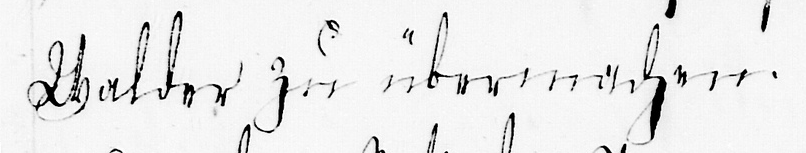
Walder zu übermachen.
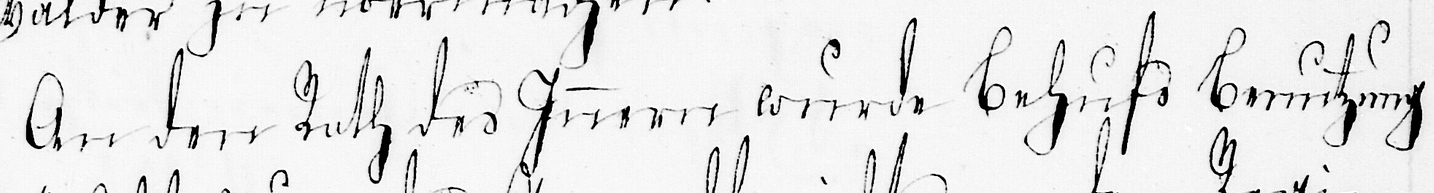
An den Rath des Innern wurde Behufs Benutzung
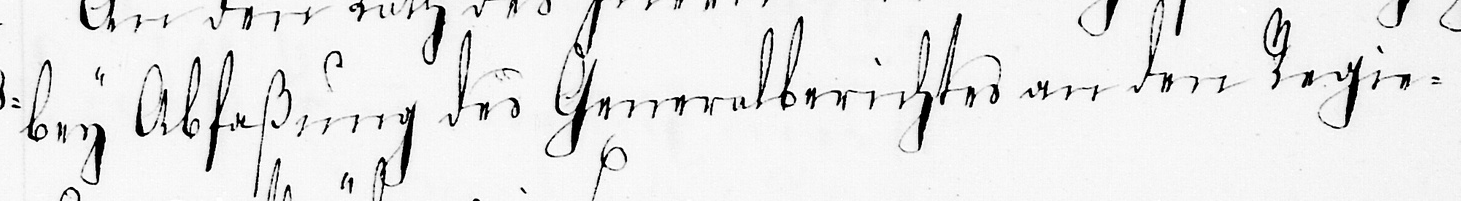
bey Abfaßung des Generalberichtes an den Regie¬
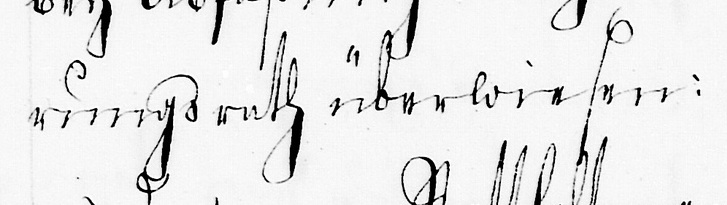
rungsrath überwiesen:
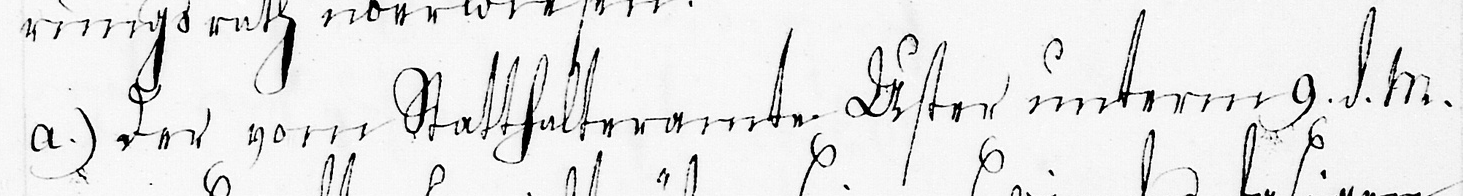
a.) Der vom Statthalteramte Uster unterm 9. d. M.
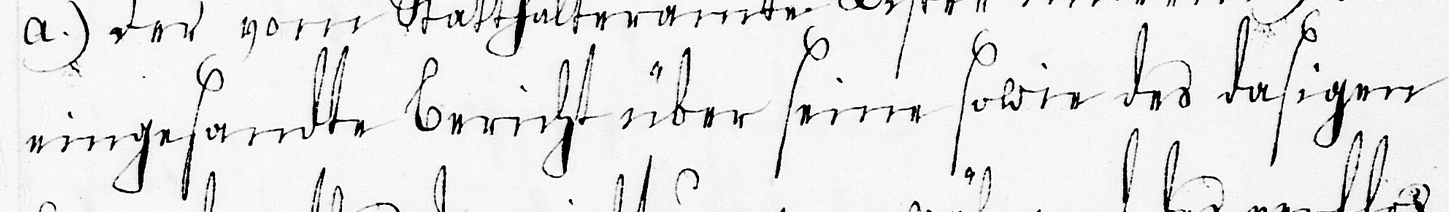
eingesandte Bericht über seine sowie des dasigen
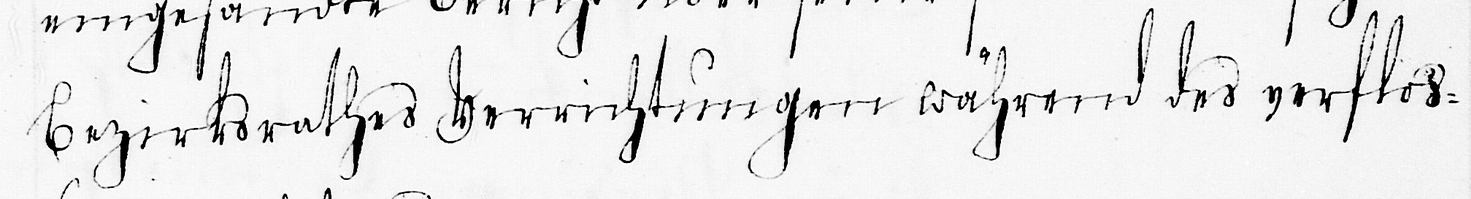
Bezirksrathes Verrichtungen während des verfloß¬
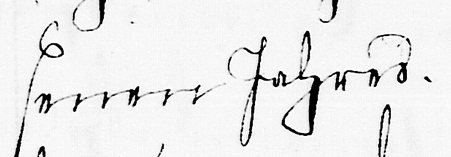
enen Jahres.
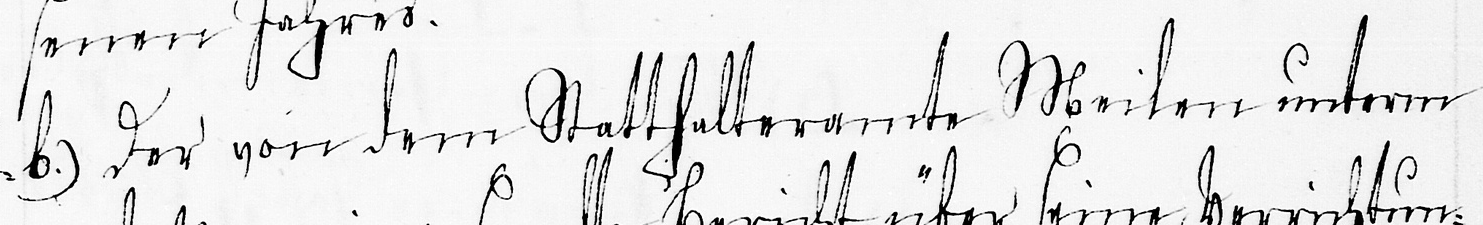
b.) Der von dem Statthalteramte Meilen unterm
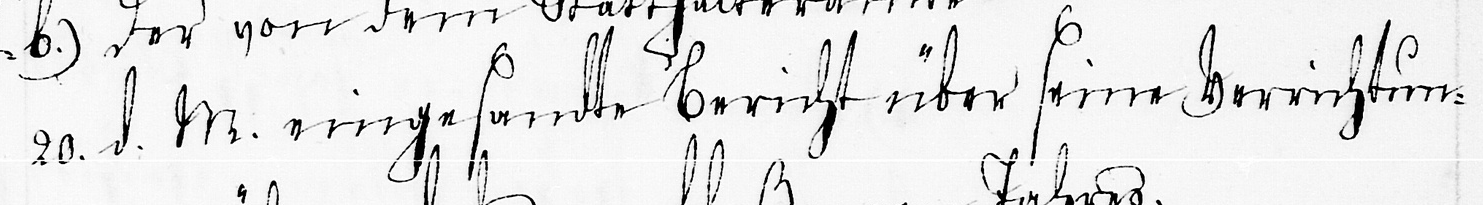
20. d. M. eingesandte Bericht über seine Verrichtun¬
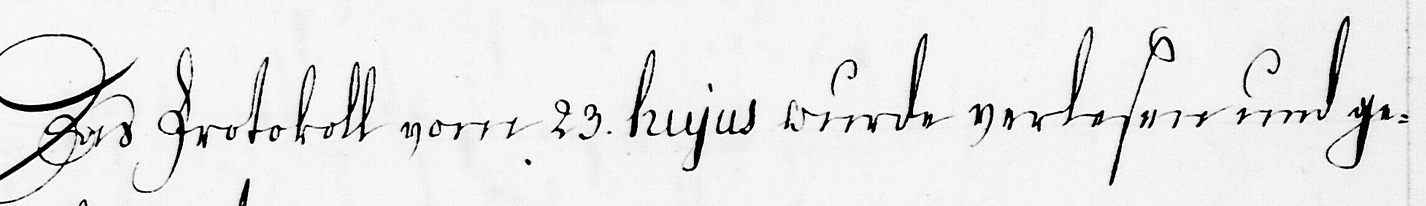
Das Protokoll vom 23. hujus wurde verlesen und ge¬
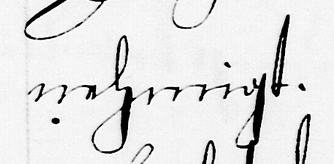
nehmigt.
